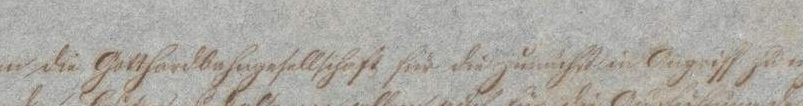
deren die Gotthardbahngesellschaft für die zunächst in Angriff zu
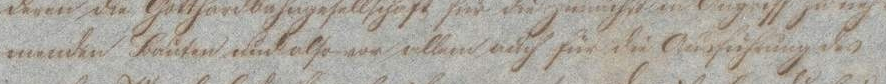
menden Bauten und also vor allem auch für die Ausführung des
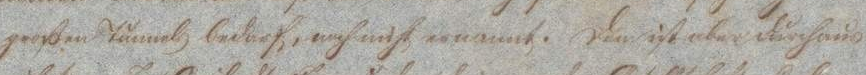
großen Tunnels bedarf, noch nicht ernannt. Dem ist aber durchaus
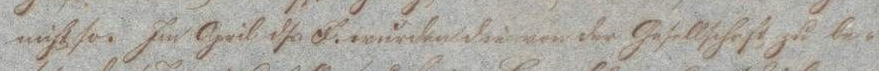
nicht so. Im April dss. J. wurden die von der Gesellschaft zu be-
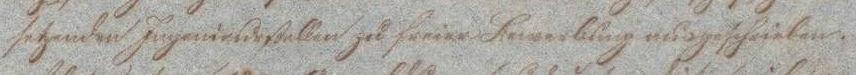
setzenden Ingenieurstellen zu freier Bewerbung ausgeschrieben.
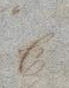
Es
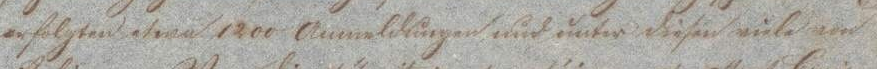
erfolgten etwa 1200 Anmeldungen und unter diesen viele von
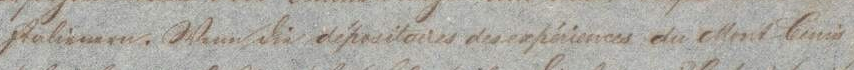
Italienern. Wem die dépositaires des expériences du Mont Cenis
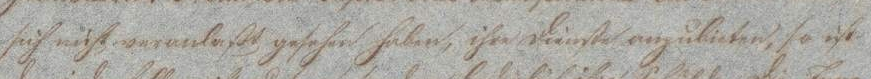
sich nicht veranlaßt gesehen haben, ihre Dienste anzubieten, so ist
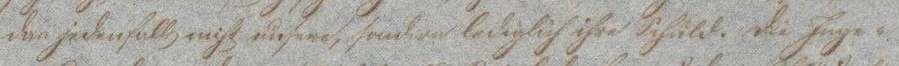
das jedenfalls nicht unsere, sondern lediglich ihre Schuld. Die Inge-
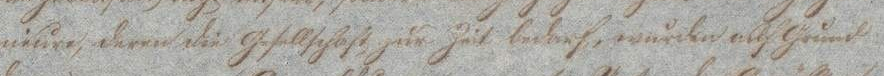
nieure, deren die Gesellschaft zur Zeit bedarf, wurden auf Grund
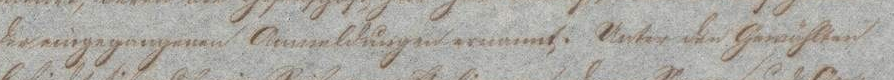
der eingegangenen Anmeldungen ernannt. Unter den Gewählten
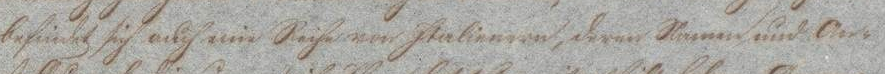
befindet sich auch eine Reihe von Italienern, deren Namen und An-
